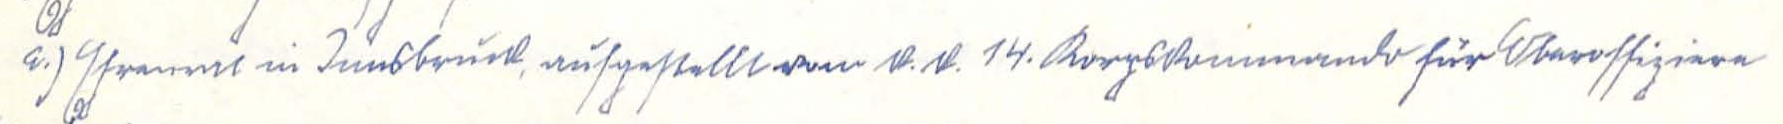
a.) Ehrenrat in Innsbruck, aufgestellt vom k.k. 14. Korpskommando für Oberoffiziere
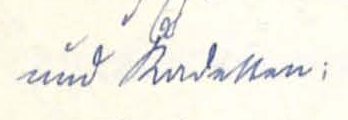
und Kadetten:
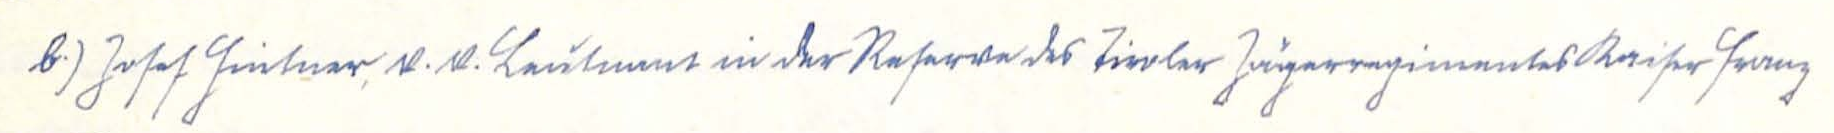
b.) Josef Hintner, k.k. Leutnant in der Reserve des Tiroler Jägerregimentes Kaiser Franz
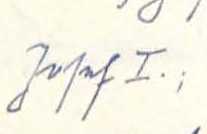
Josef I.;
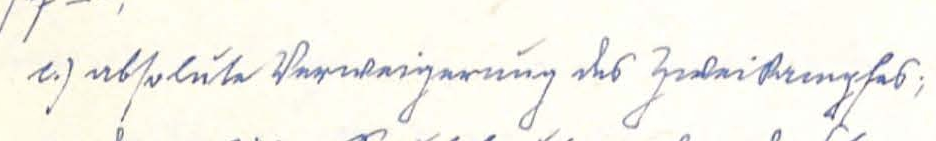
c.) absolute Verweigerung des Zweikampfes;
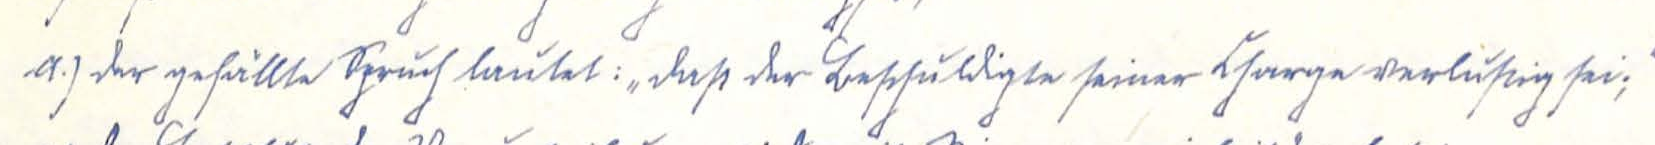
d.) Der gefällte Spruch lautet: „Daß der Beschuldigte seiner Charge verlustig sei;"
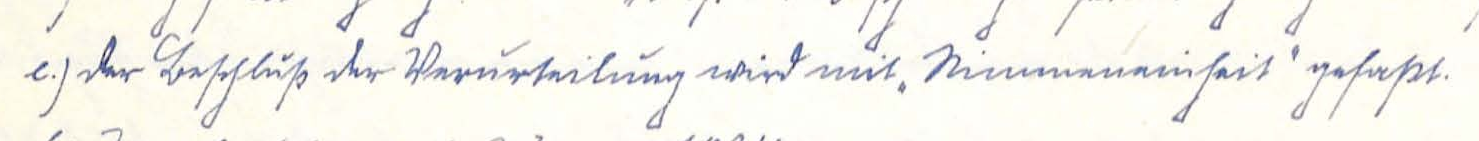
e.) der Beschluss der Verurteilung wird mit „Stimmeneinheit“ gefaßst.
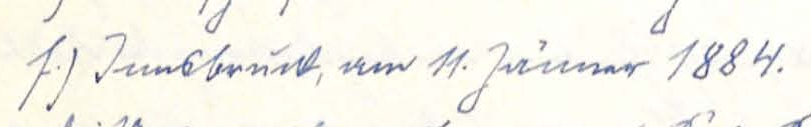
f) Innsbruck, am 11. Jänner 1884.
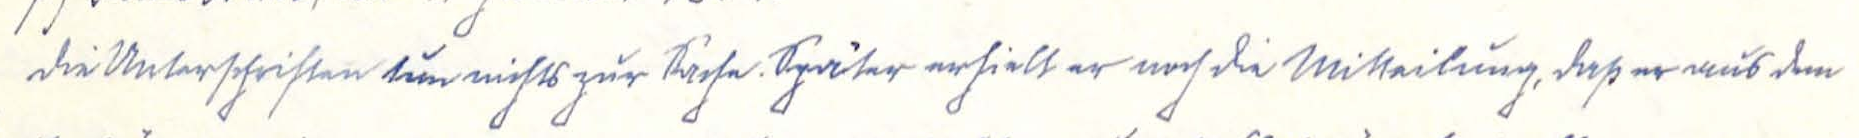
Die Unterschriften tun nichts zur Sache. Später erhielt er noch die Mitteilung, daß er aus dem
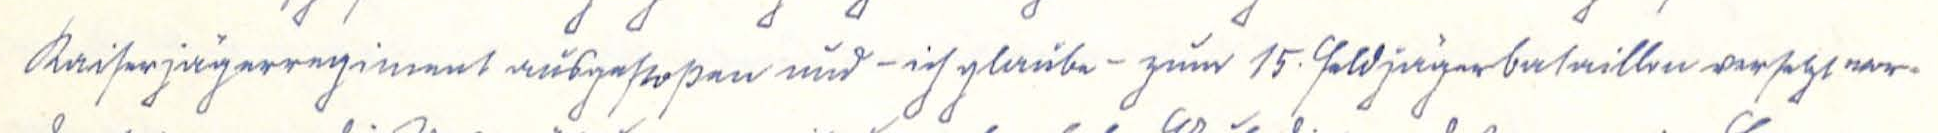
Kaiserjägerregiment ausgestoßen und- ich glaube- zum 15. Feldjägerbataillon versetzt wor-
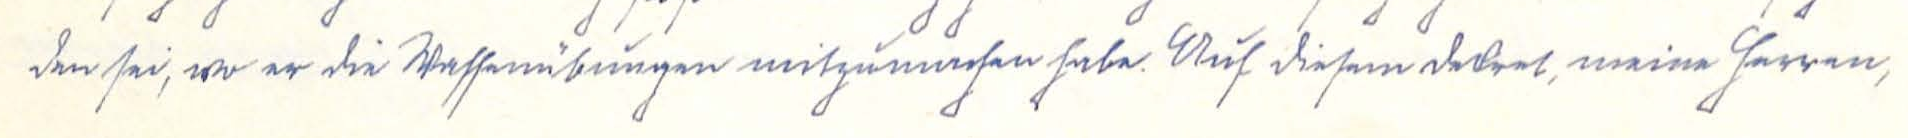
den sei, wo er die Waffenübungen mitzumachen habe. Auf diesem Dekret meine Herren,
